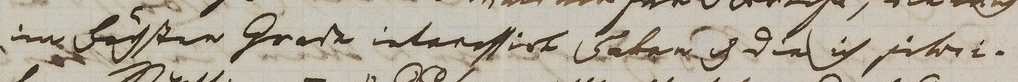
im höchsten Grade interessirt haben & die ich jewei-
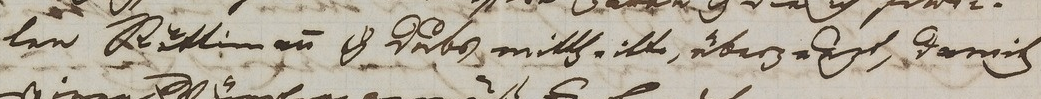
len Rüttimann & Dubs mittheilte, überzeugt, damit
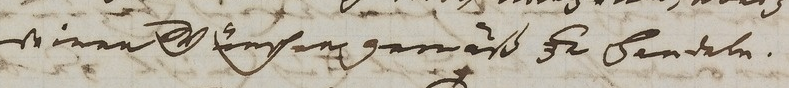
Deinen Wünschen gemäß zu handeln.
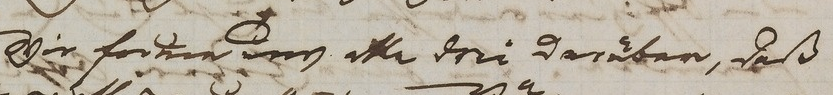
Wir freuen uns alle drei darüber, daß
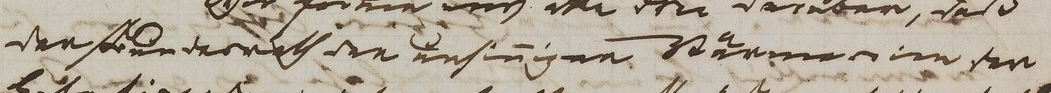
der Bundesrath den unsinnigen Stürmereien der
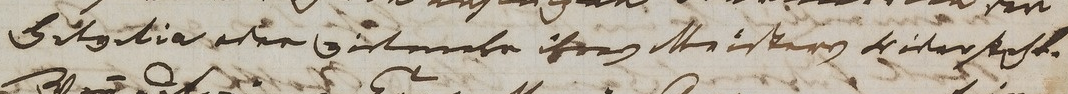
Helvetia oder vielmehr ihres Meisters widersteht.
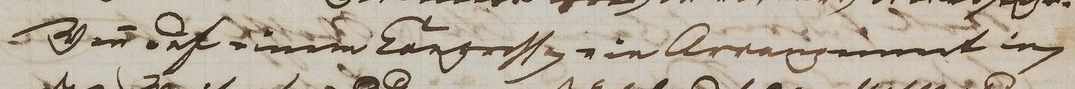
Wenn auf einem Congresse ein Arrangement in
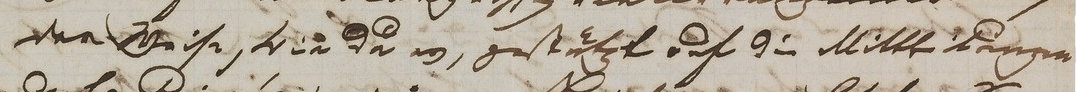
der Weise, wie Du es, gestützt auf die Mittheilungen
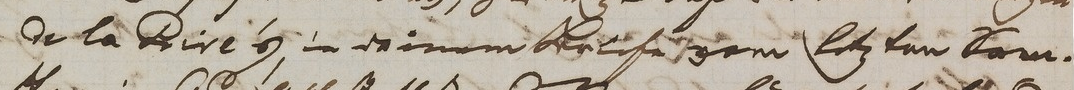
de la Rive's, in Deinem Briefe vom letzten Sam-
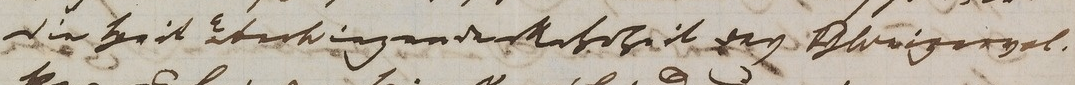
die weit überwiegende Mehrheit des Schweizervol-
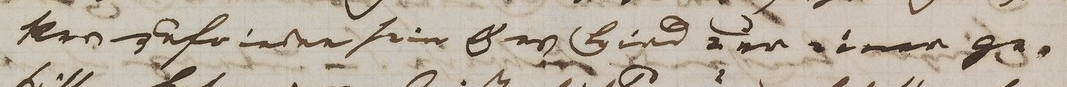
kes zufrieden sein & es wird nur einer ge-
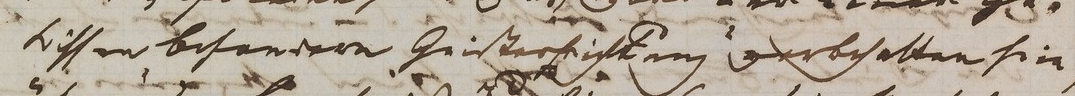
wissen besondern Geistesrichtung vorbehalten sein,
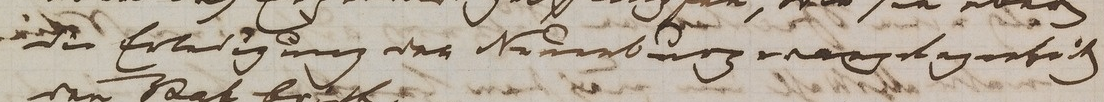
die Erledigung der Neuenburgerangelegenheit
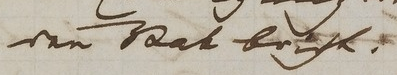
den Stab bricht.
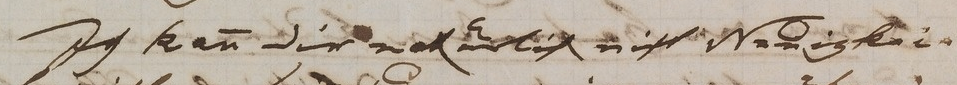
Ich kann dir natürlich nicht Neuigkei-
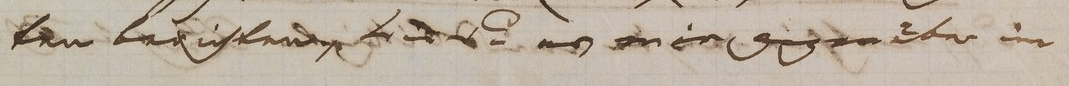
ten berichten, wie Du es mir gegenüber im
